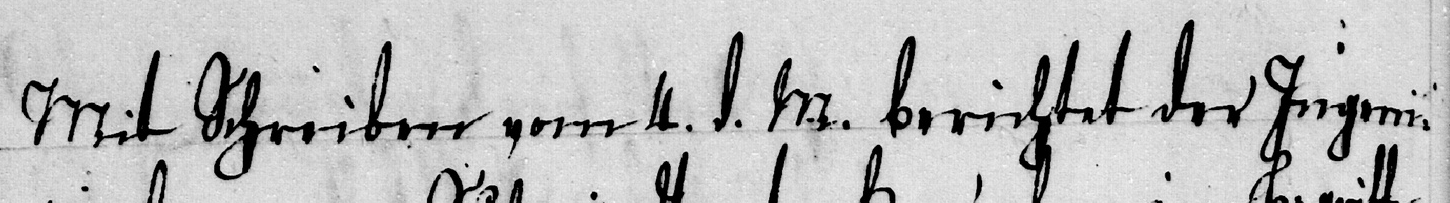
Mit Schreiben vom 4. d. M. berichtet der Ingeni¬
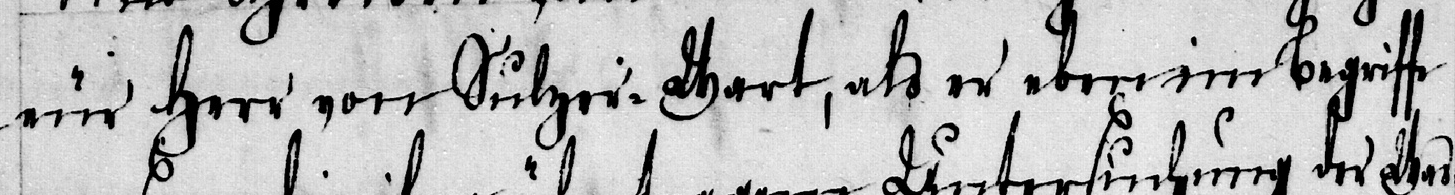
eur Herr von Sulzer-Wart, als er eben im Begriffe
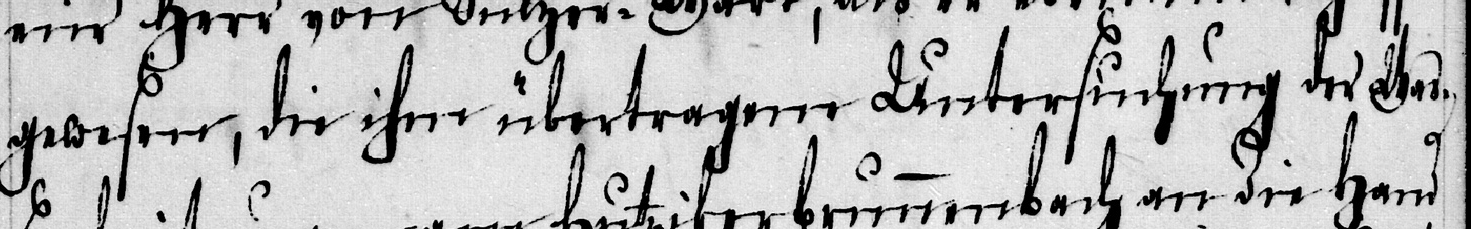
gewesen, die ihm übertragene Untersuchung der Waß¬
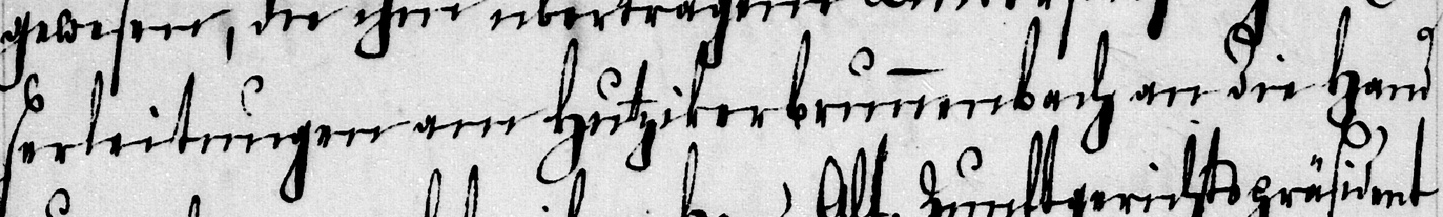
erleitungen am Hutzikerbrunnenbach an die Hand
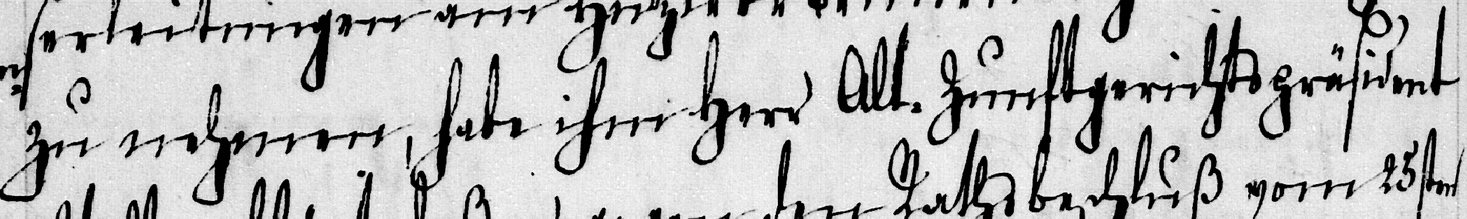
zu nehmen, habe ihm Herr Alt-Zunftgerichtspräsident
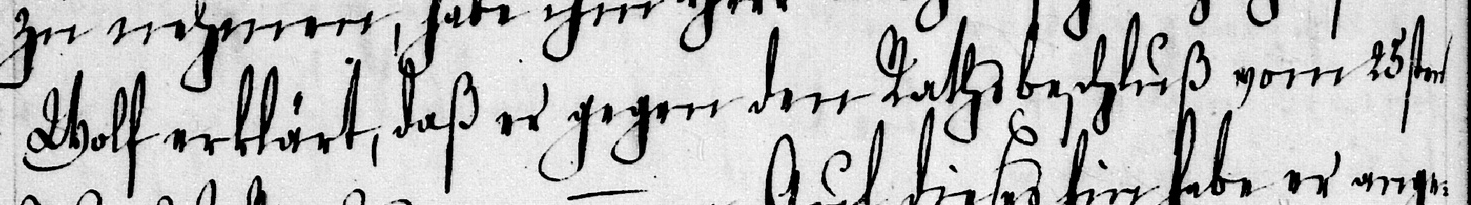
Wolf erklärt, daß er gegen den Rathsbeschluß vom 25sten
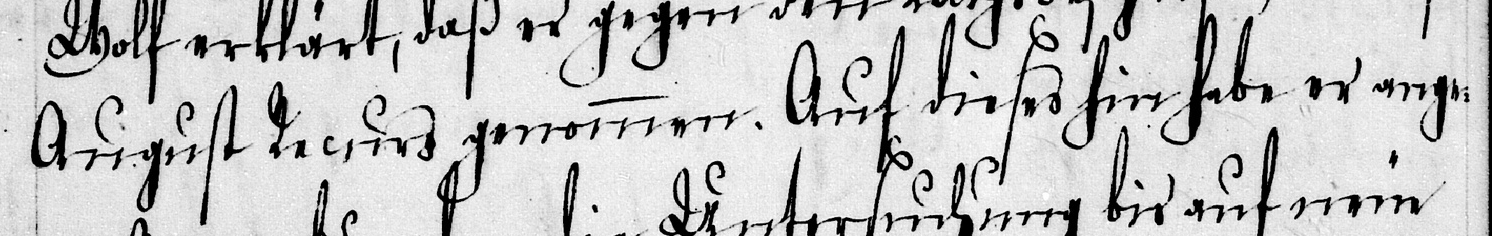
August Recurs genommen. Auf dieses hin habe er ange¬
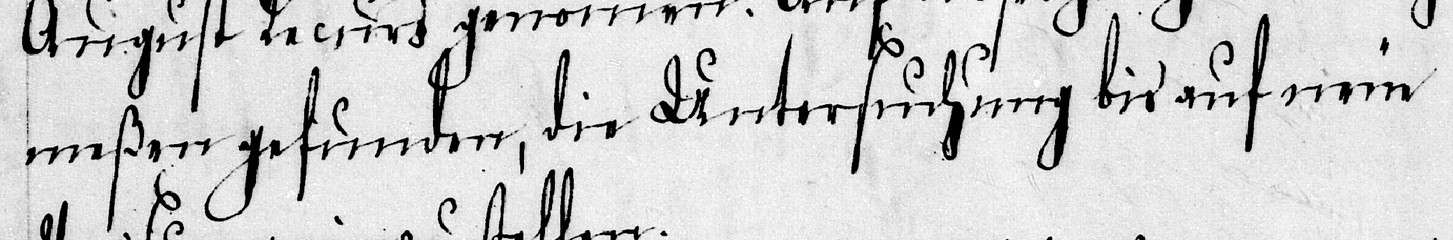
meßen gefunden, die Untersuchung bis auf neue
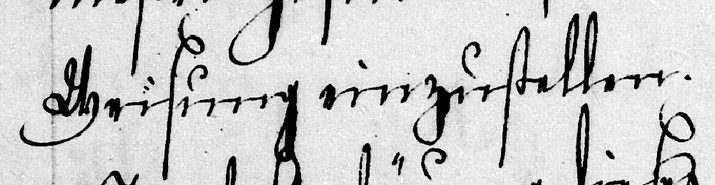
Weisung einzustellen.
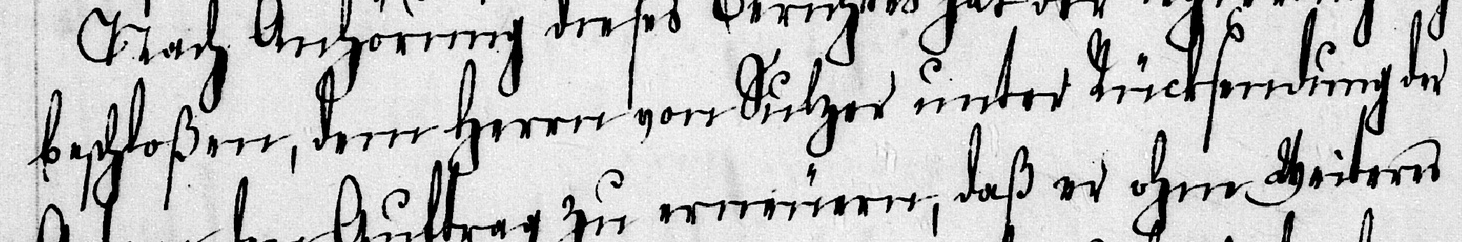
beschloßen, dem Herrn von Sulzer unter Rücksendung der
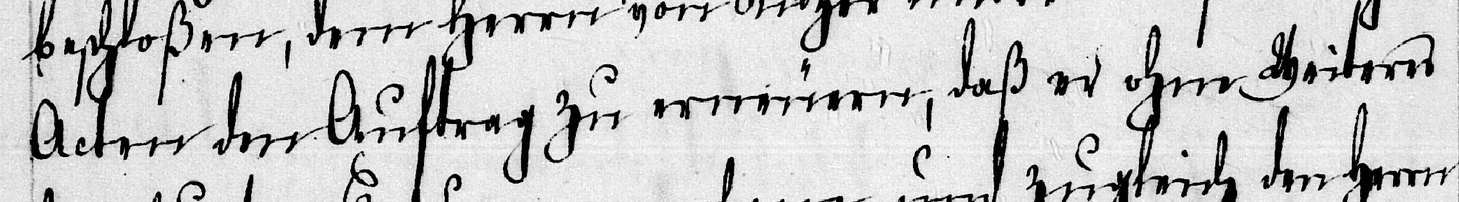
Acten den Auftrag zu erneuern, daß er ohne Weiteres
